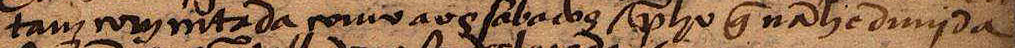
tam comcertada como aos sabados / p̄o ho q̄ nā he duujda
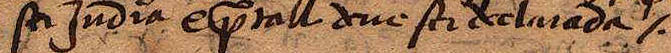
ser Judia e p̄o tall deue ser declarada /.
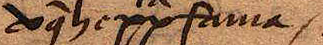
do q̄ he ppca fama /.
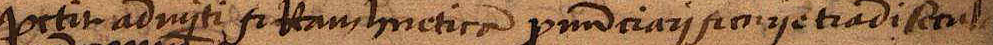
Petit admjti e Ream hereticā ꝓnūciarj e curje tradi secula
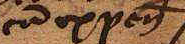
cū expen̄ /
